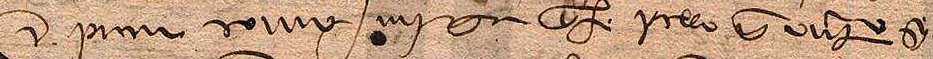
ēpeçer como Jmjga q̄ he pello q̄ outrosy
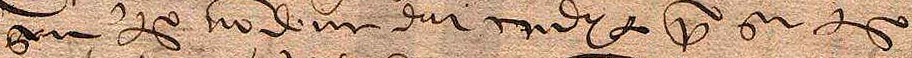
seu tso n̄o deue dar credyto p̄o ser tso
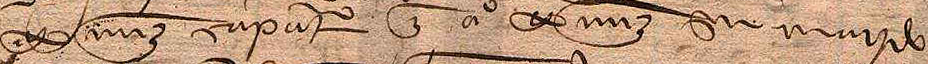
gomez capatro item ao gomez seu marjdo
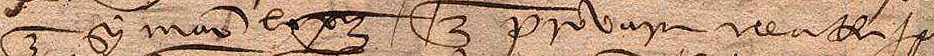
item symão lopez / / item provara ella Re Jsa
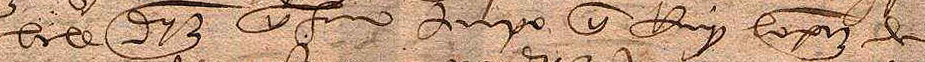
bell d̄yz q̄ hao tenpo q̄ Ruy lopez de
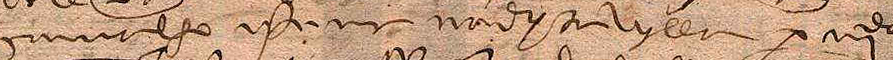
carualho esteue na dyta vylla ꝑ mdo
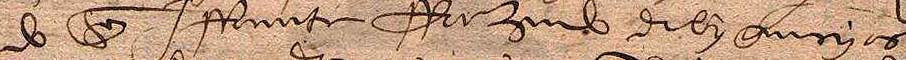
do S̄or Jffamte ffazendo dilygencyas
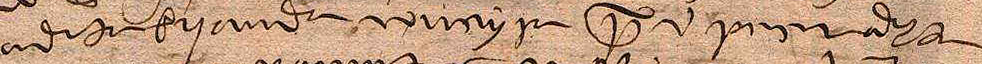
a dita brjanda couceyra p̄o ēpecer a dyta
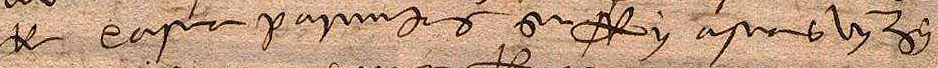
Re e a sua parentas se ffoy a suas vyzy
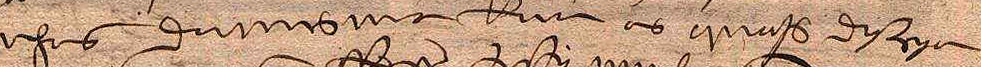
nhas da mesma Rua as quajs dyzya
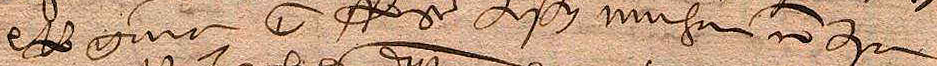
e Rogara que ffosē testymuhar c̄otra
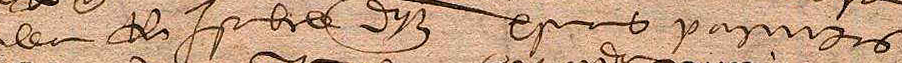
ella Re Jsabell d̄yz e suas parentas
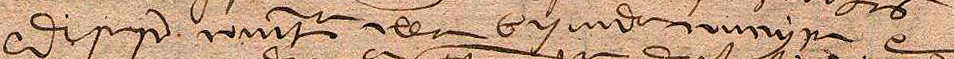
e disesē comtra ella brjamda couceyra e
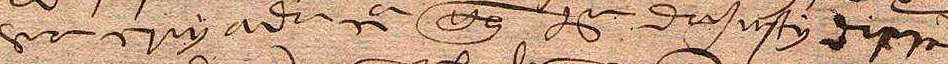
sua cryada ca ḡlz tsa da Justy diserā
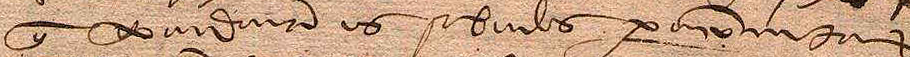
q̄ goardauā os sabados ꝑa c̄ocertar
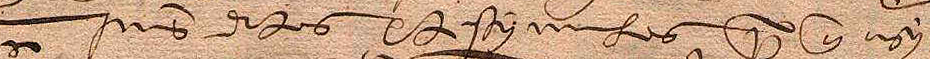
c̄o seus ditos e testymnhos p̄oq̄ asy
